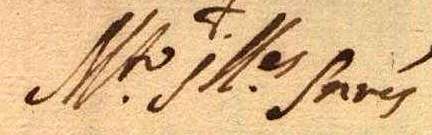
M.to Ill.es Snres̄
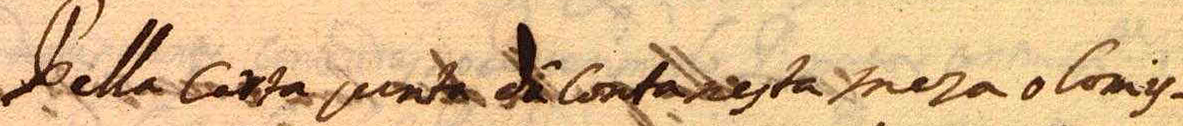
Pella carta junta dá conta nesta meza o Comis
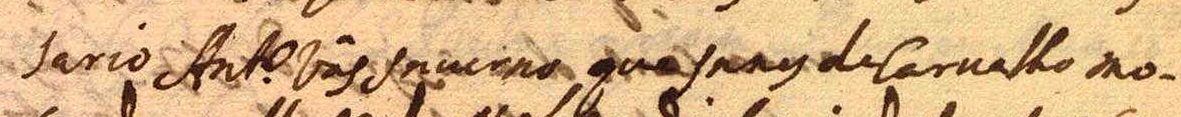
sario Ant.o Vas jnuerno que Jnnes de Carualho mo
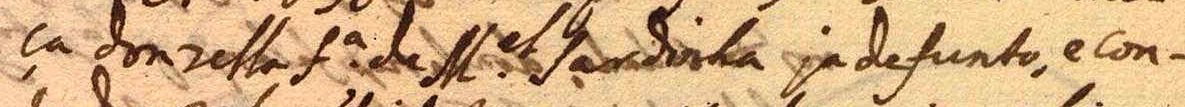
ça donzella f.a de M.el Sardinha ja defunto, e con
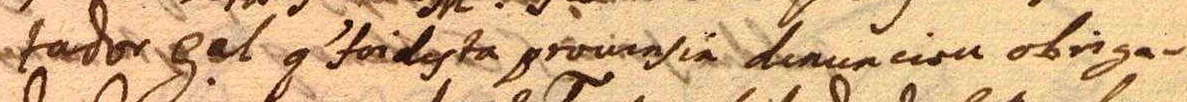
tador g.al q̄ foi desta prouinsia denunciou obriga
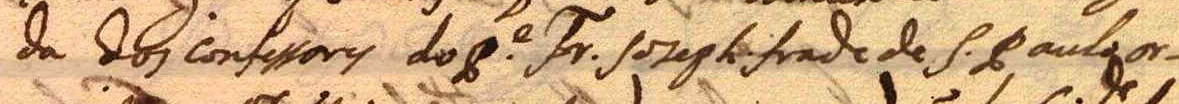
da dos confessores do p.e Fr. Joseph frade de S. Paulo or
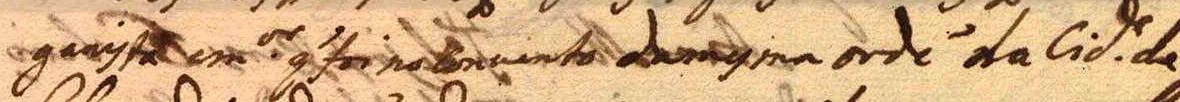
ganista e m.or q̄ foi no conuento da mesma ordē da Cid.e de
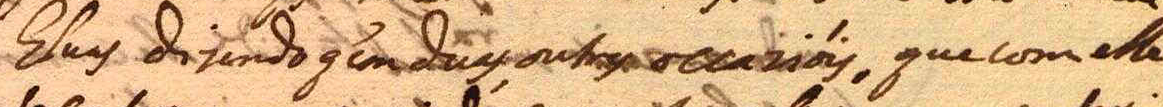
Eluas dizendo q̄ em duas outras occazioĩs, que com elle
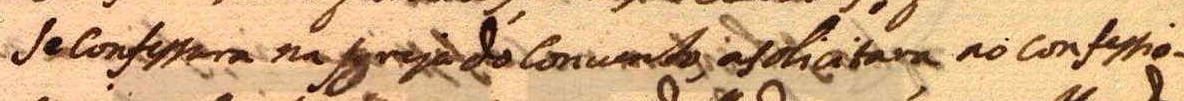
se confessara na jgreja do conuento, a solicitara no confessio
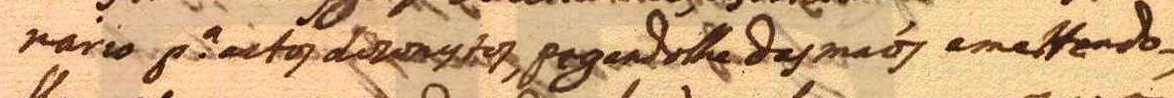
nario p.a actos dezonestos, pegandolhe das maõs e mettendo
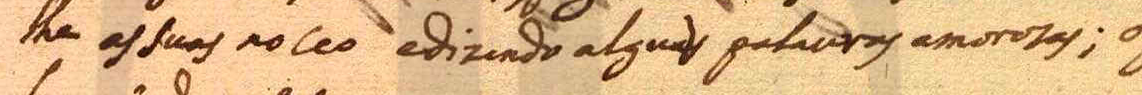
lhe as suas no ceo e dizendo alguās palauras amorosas; o q̄
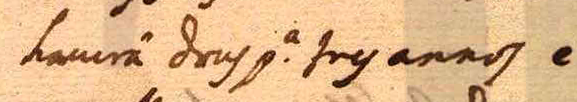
hauerá dous p.a tres annos e
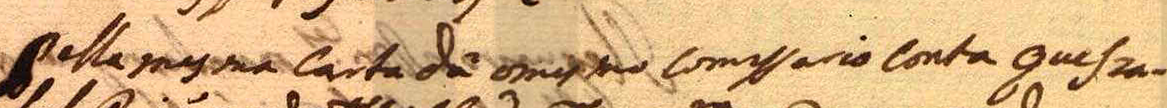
pella mesma carta da o mesmo comissario conta que jza
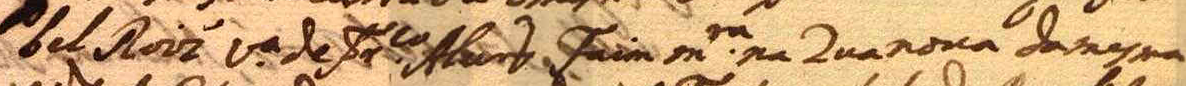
bel Roiz̄ v.a de Fr.co Alurs̄ Faim mra. na Rua noua da mesma
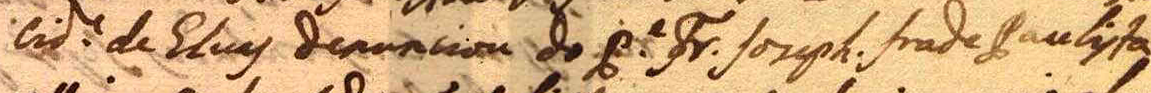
cid.e de Eluas denunciou do p.e Fr. Jozeph. frade Paulista
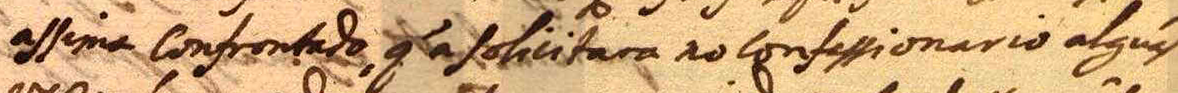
assima confrontado, q̄ a solicitara no confessionario alguās
